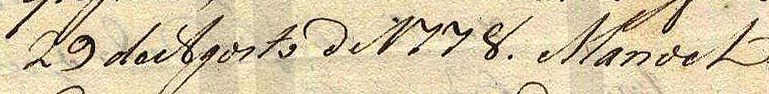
29 de Agosto de 1778. Manoel
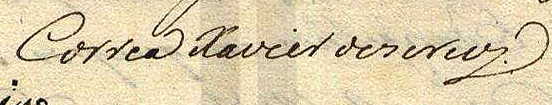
Correa Xavier o escrevj.
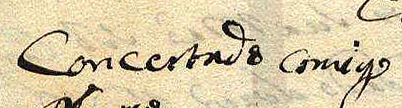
Concertado comigo
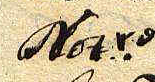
Notr.o
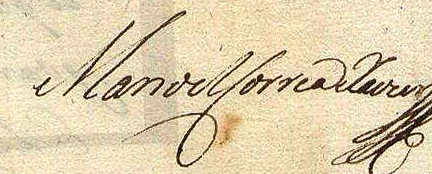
Manoel Correa Xavier
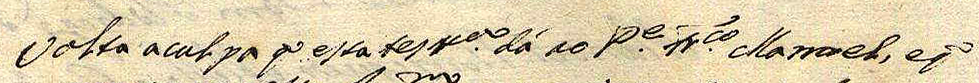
Volta a culpa q̄ esta test.a dá ao P.e Fr.co Manuel, e q̄
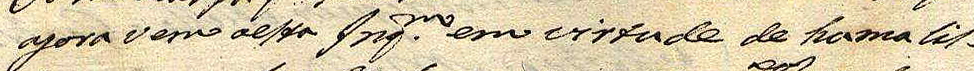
agora vem a esta Jnq.m em virtude de huma lis
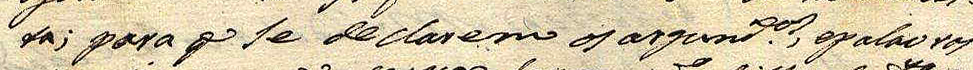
ta; para q̄ se declarem os argum.tos, e palavras
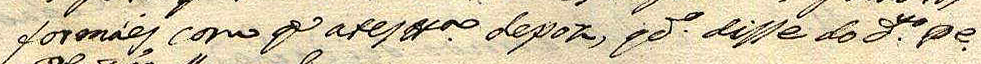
formáes com q̄ a testt.a depoz, qd.o disse do d.to P.e
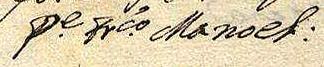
p.e Fr.co Manoel:
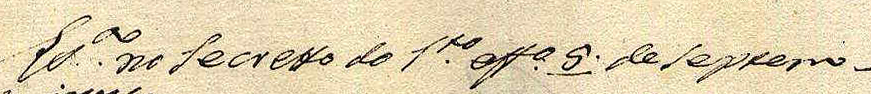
Ls.a no secretto do s.to off.o 5. de septem
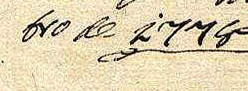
bro de 1778
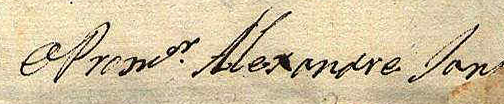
O Prom.or Alexandre Ian
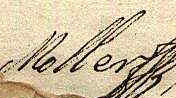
Moller
